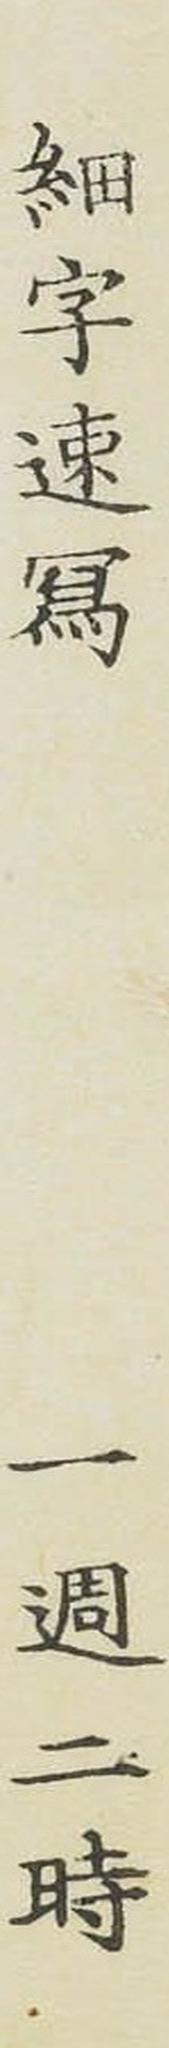細字速写一週二時
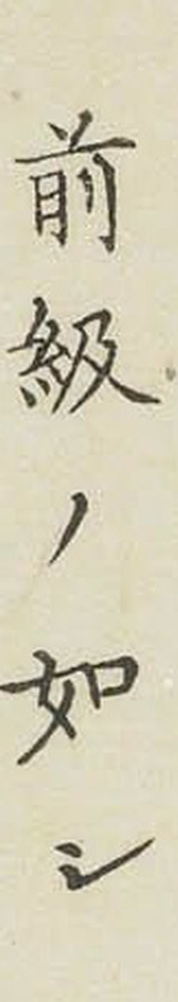前級ノ如シ
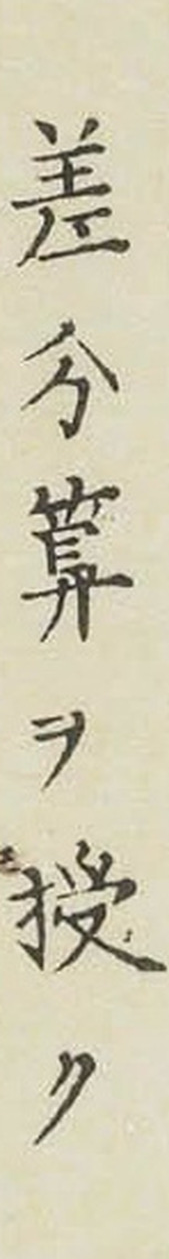差分算ヲ授ク
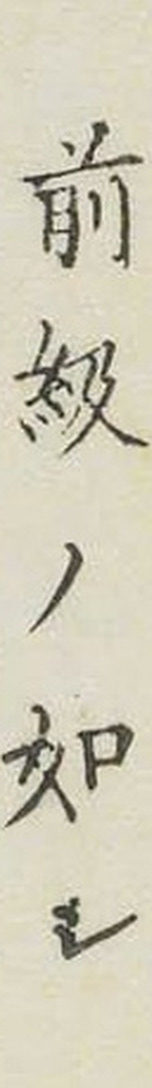前級ノ如シ
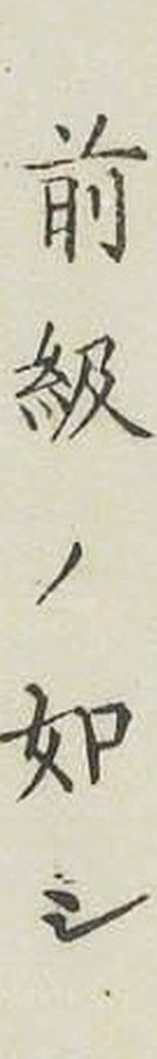前級ノ如シ
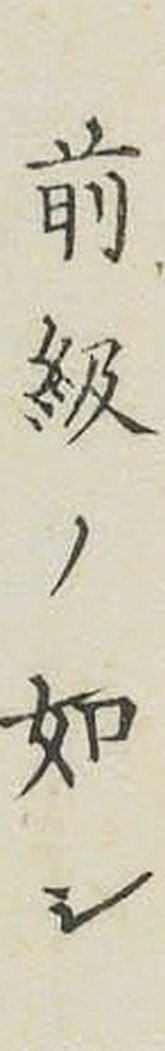前級ノ如シ
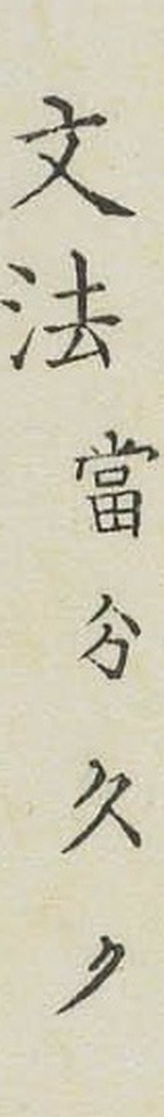文法当分欠ク
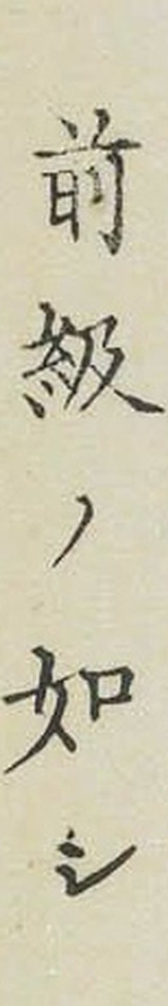前級ノ如シ

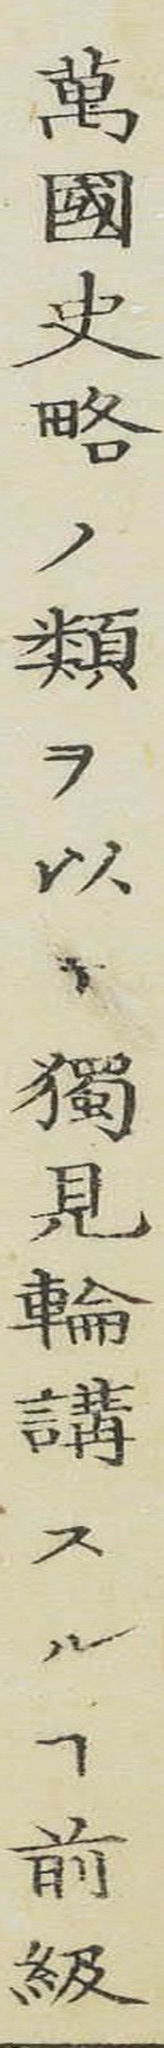万国史略ノ類ヲ以テ独見輪講スル事前級
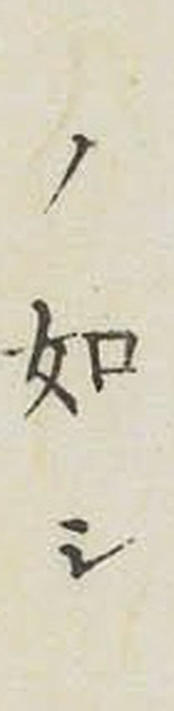ノ如シ
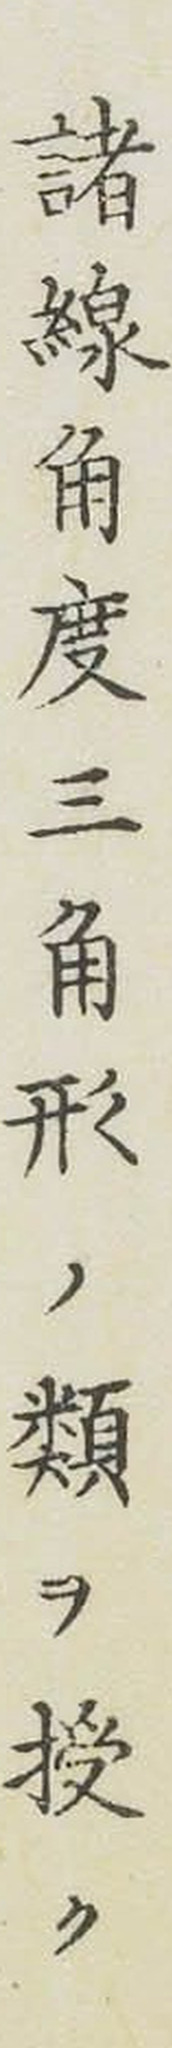緒線角度三角形ノ類ヲ授ク
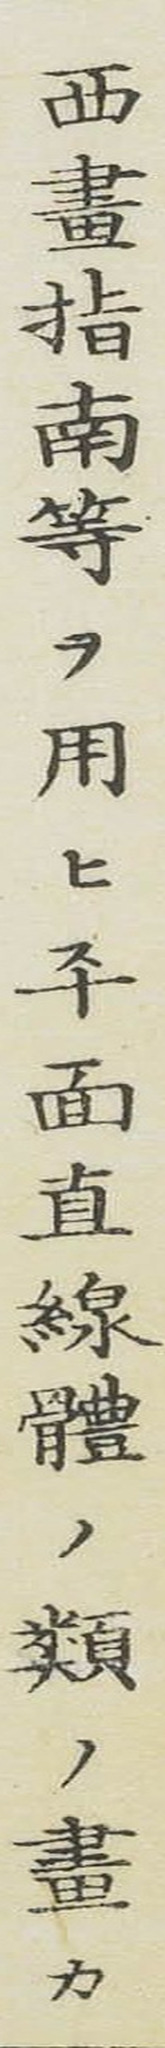西書指南等ヲ用ヒ平面直線体ノ類ヲ書カ
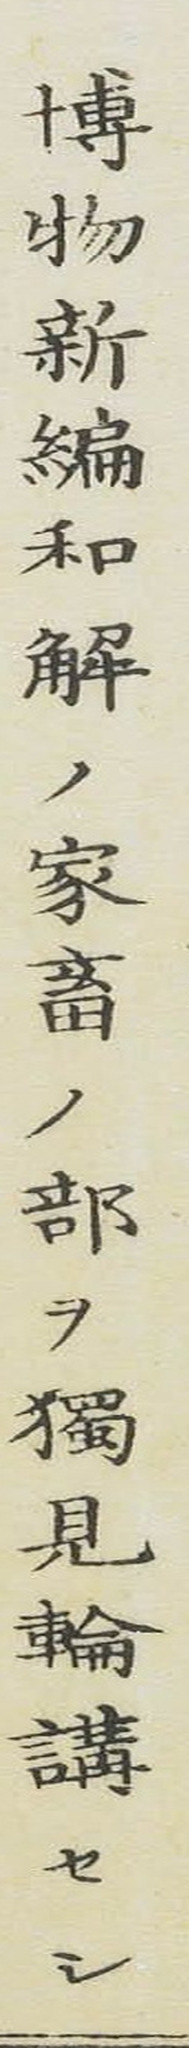博物新編和解ノ家畜ノ部ヲ独見輪講セシ
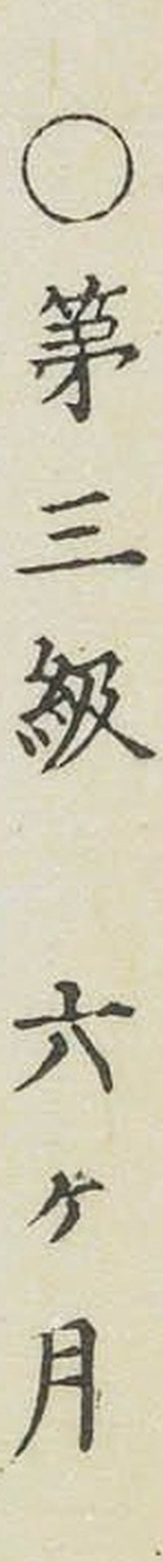○第三級六ケ月
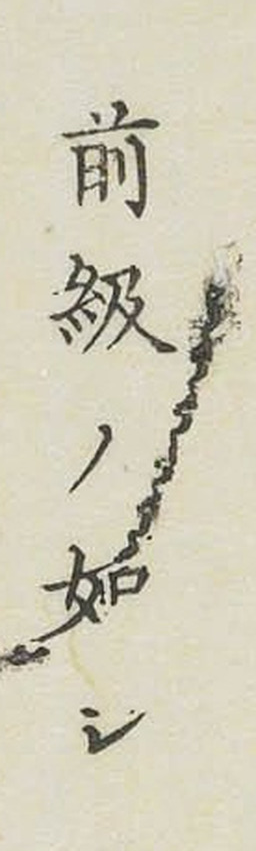前級ノ如シ
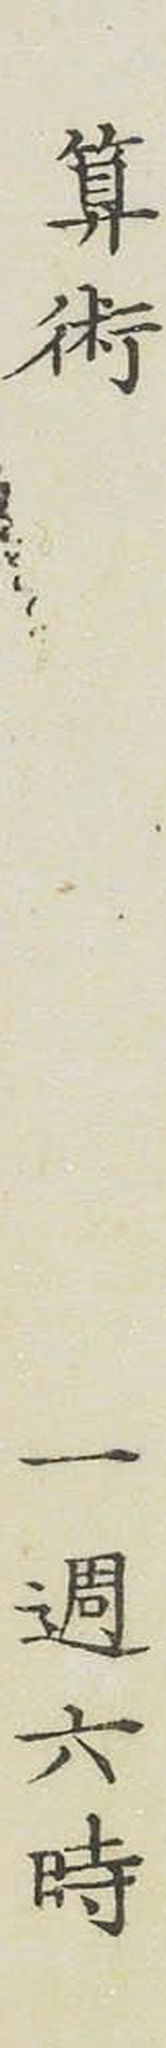算術一週六時
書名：小学教則
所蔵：東京学芸大学教育コンテンツアーカイブ
